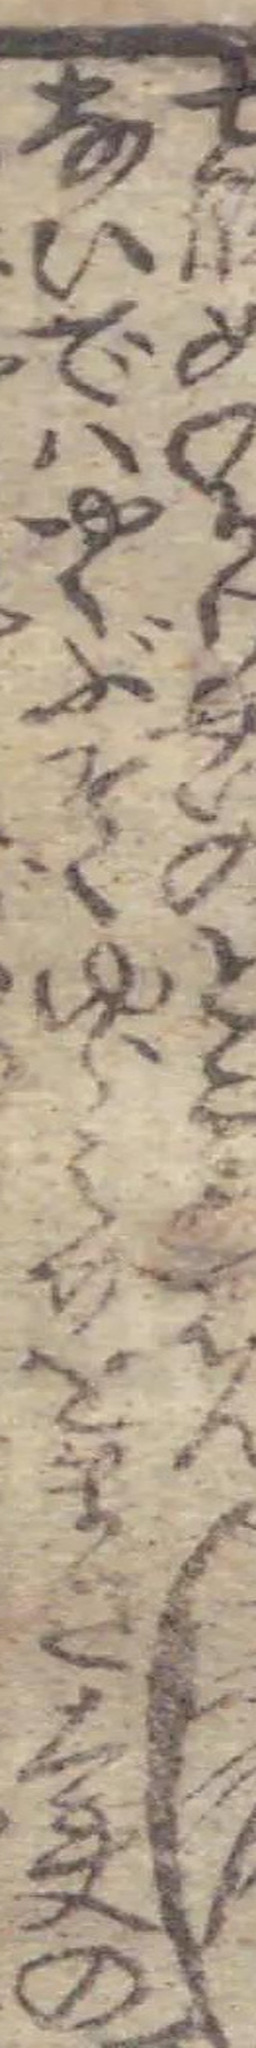ないではやくぶそくゆら之助をまさ太夫の
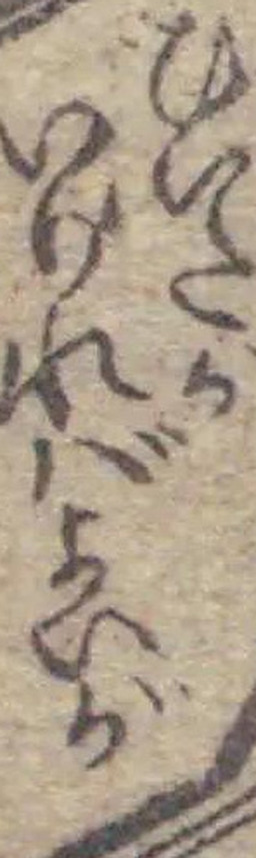いければよいが
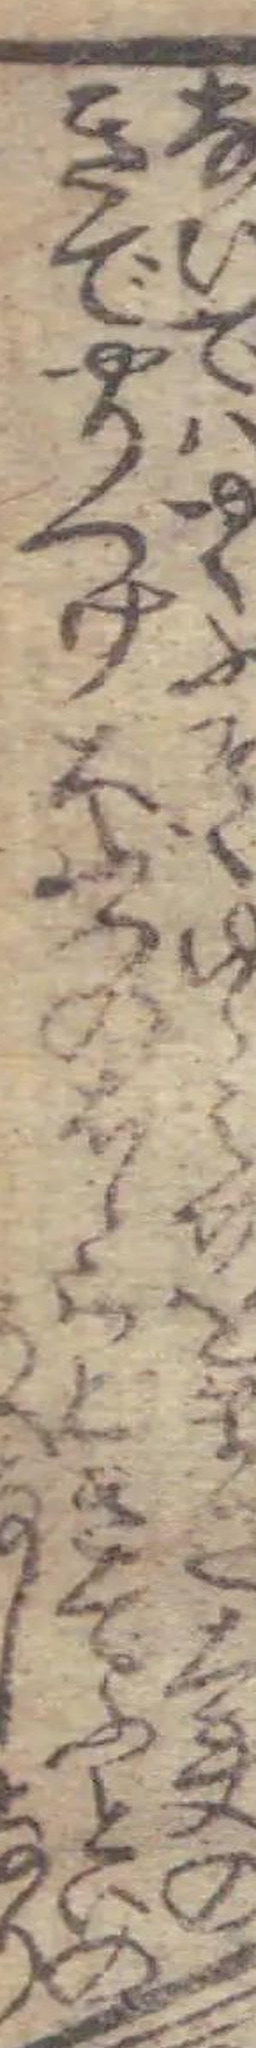きでやりつけ大ぶつのはしらときてふといの

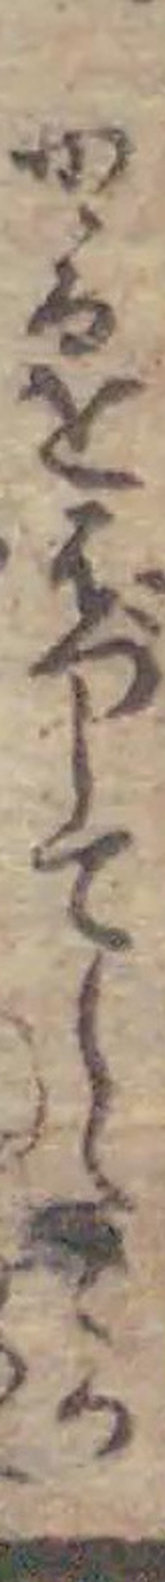かゝるをはづしてしたゝか
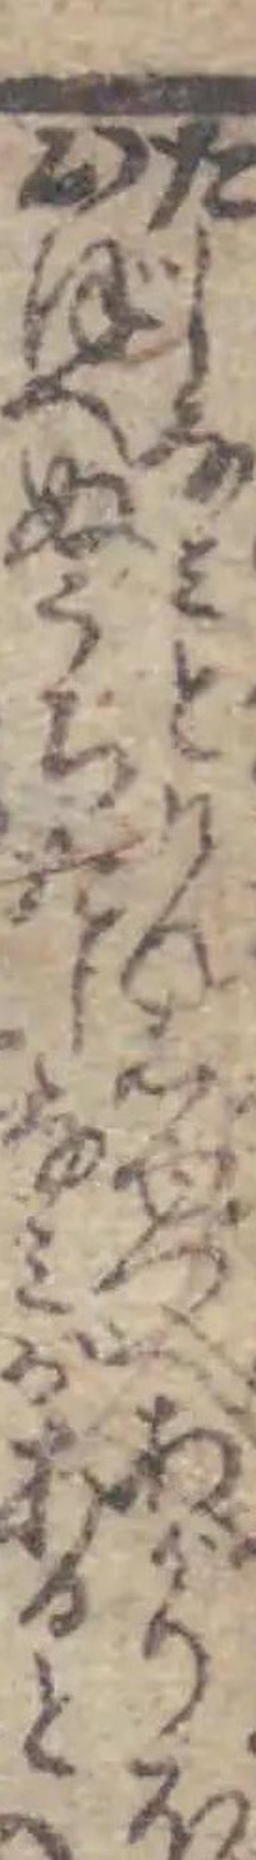おぼへぬうちたしなみがあると
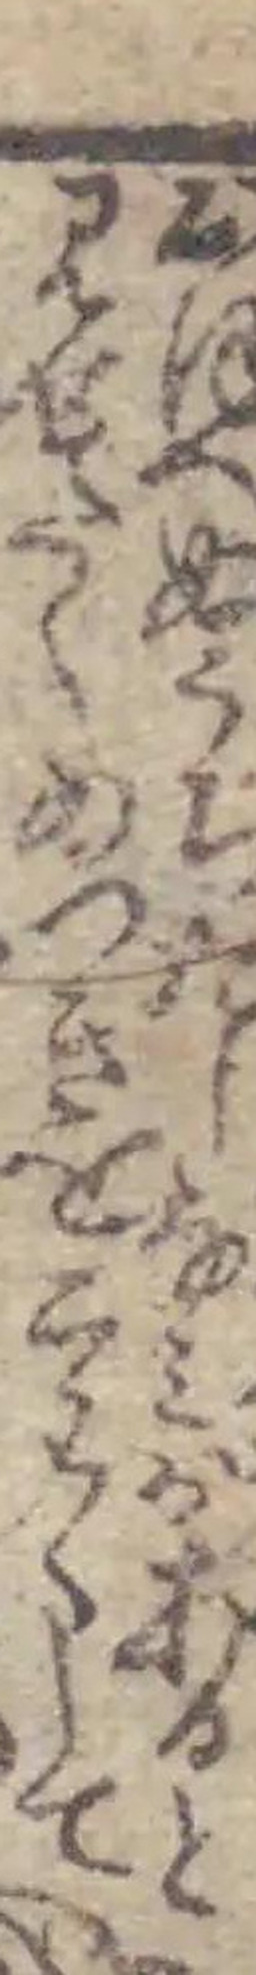見せたくめつきをこわくして
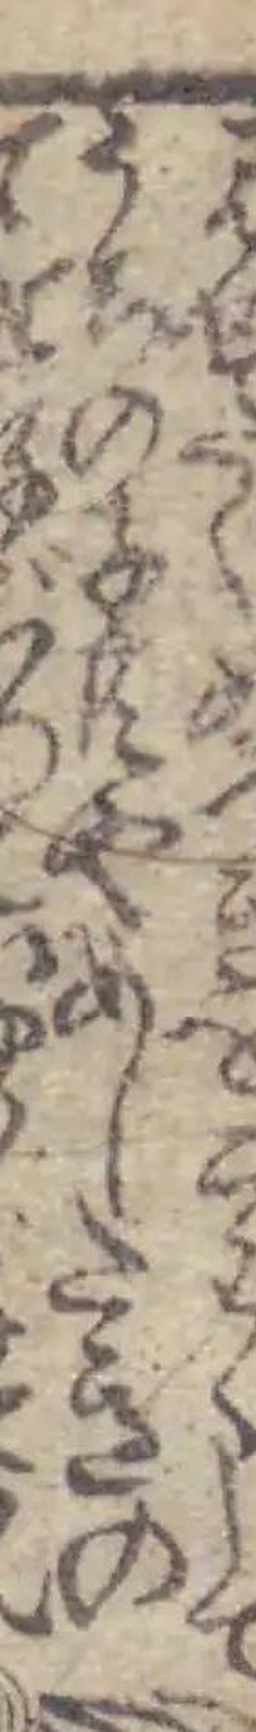うちの子共やめしたきの
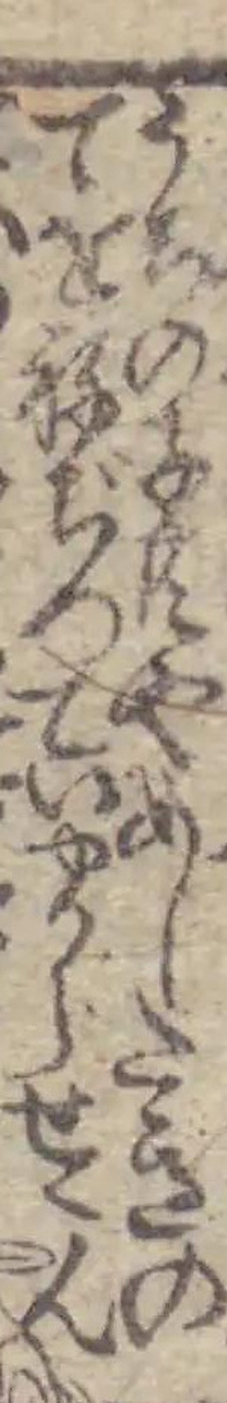てをねぢつていやからせゝん
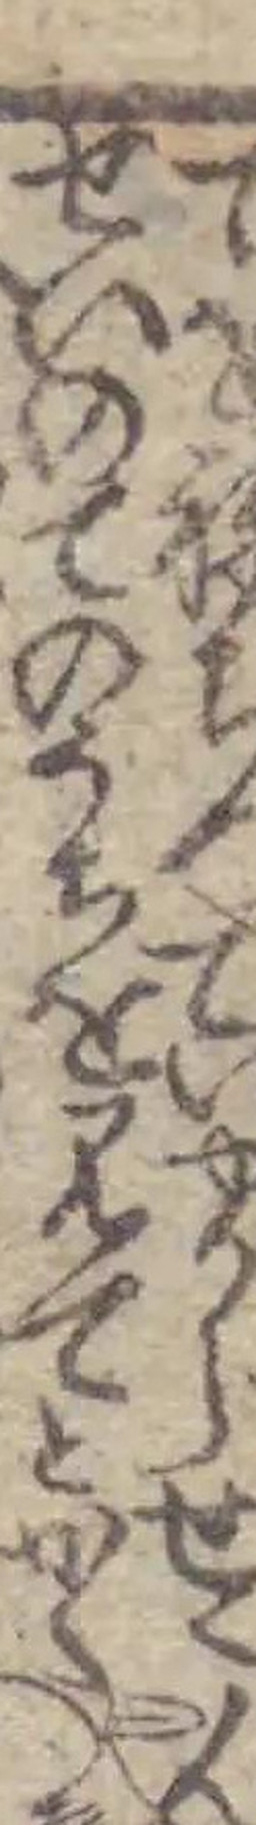せいのてのうちを見てとかく
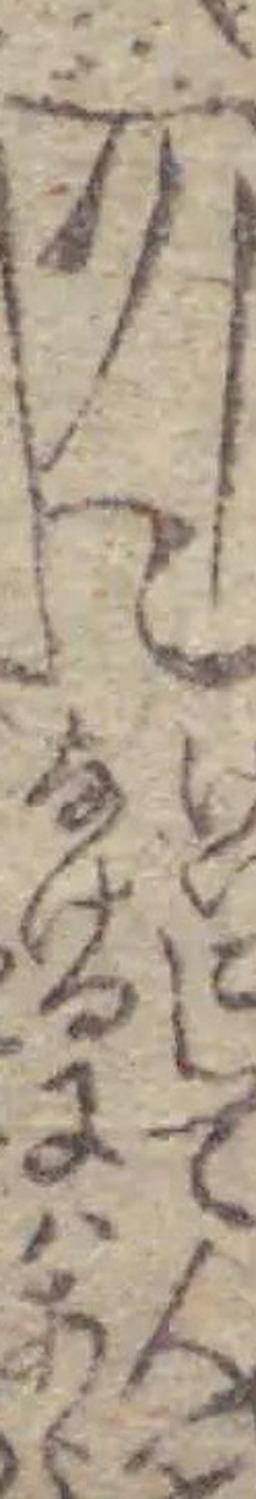なけるにはあら
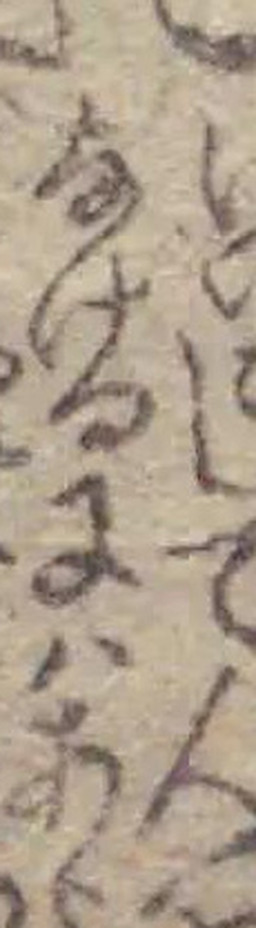なけるにはあら
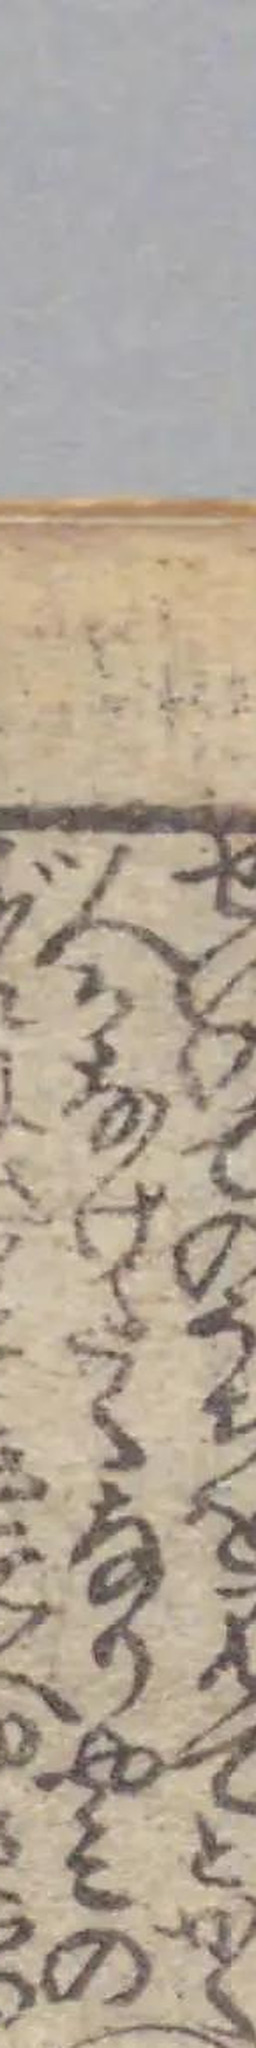人かなけたくなりやみの
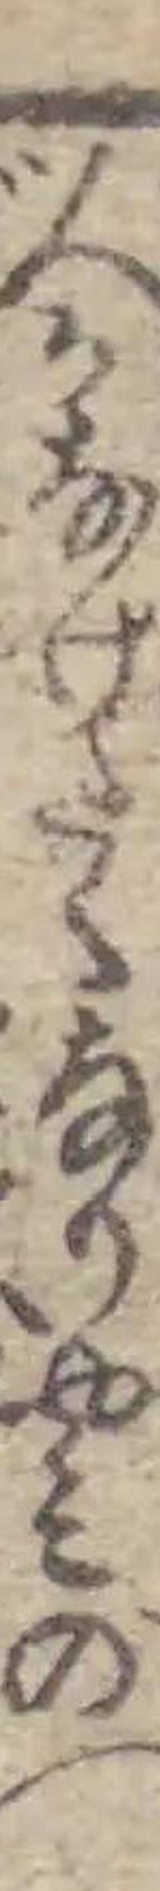人かなけたくなりやみの
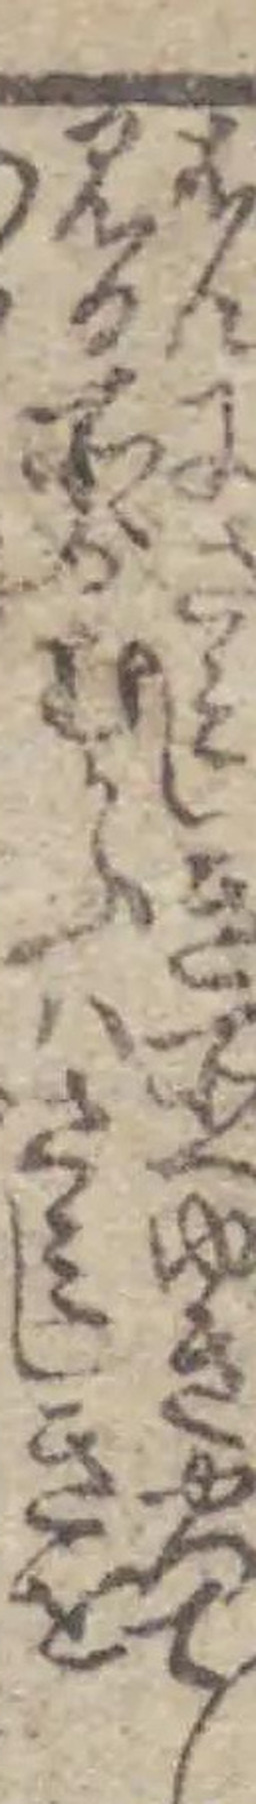見る所がむかふはさみしきを
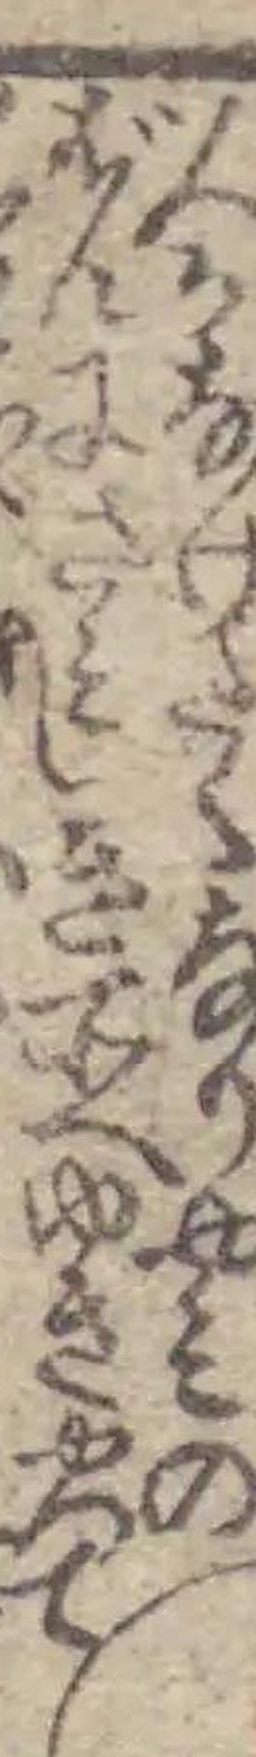ばんにさみしき所へゆきやつて
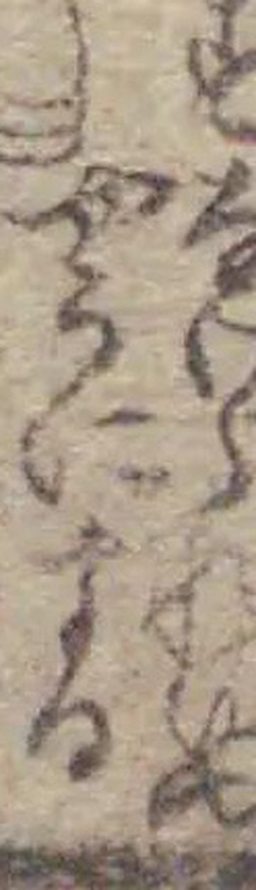やうにする
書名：津以曽無弟の甚六 3巻
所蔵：国立国会図書館 National Diet Library, JAPAN
